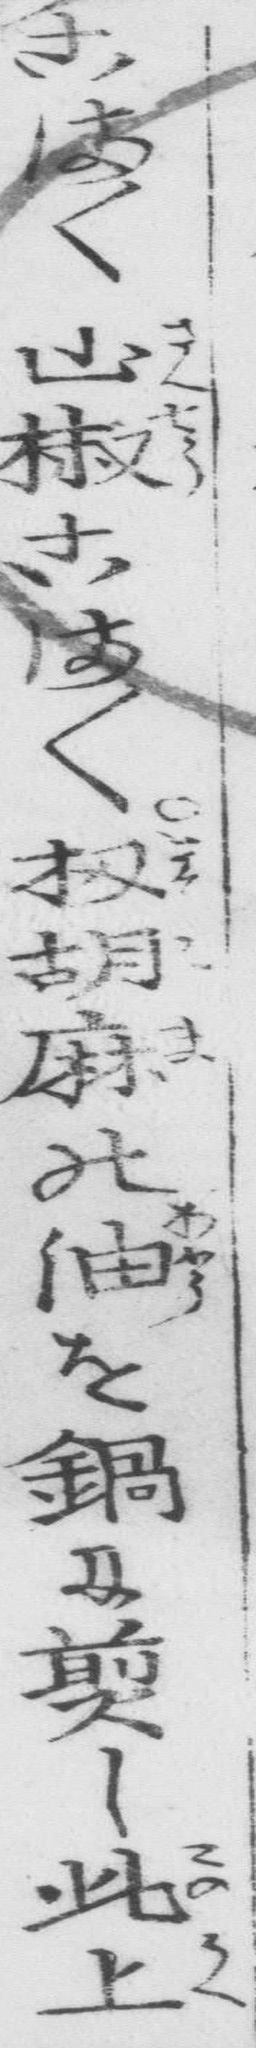こま〳〵山椒こま〳〵。扨胡麻の油を鍋に煎し此上
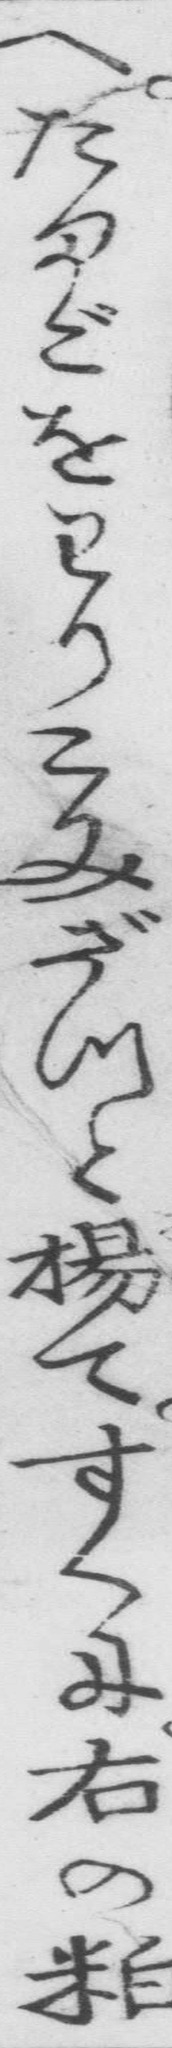へ。たまごをわりこみざつと揚て。すくに。右の粕
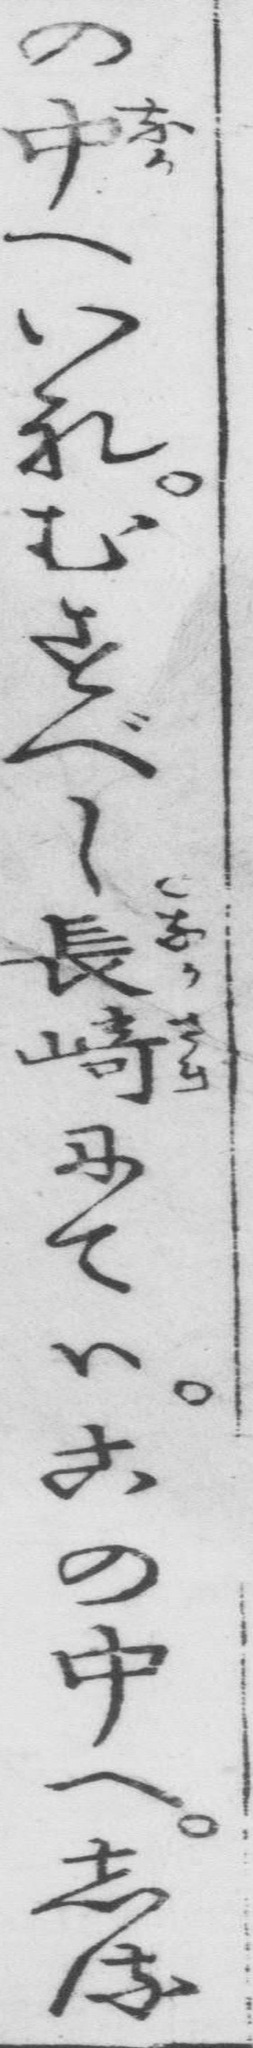の中へいれ。むすべし。長崎にては。この中へ。しる
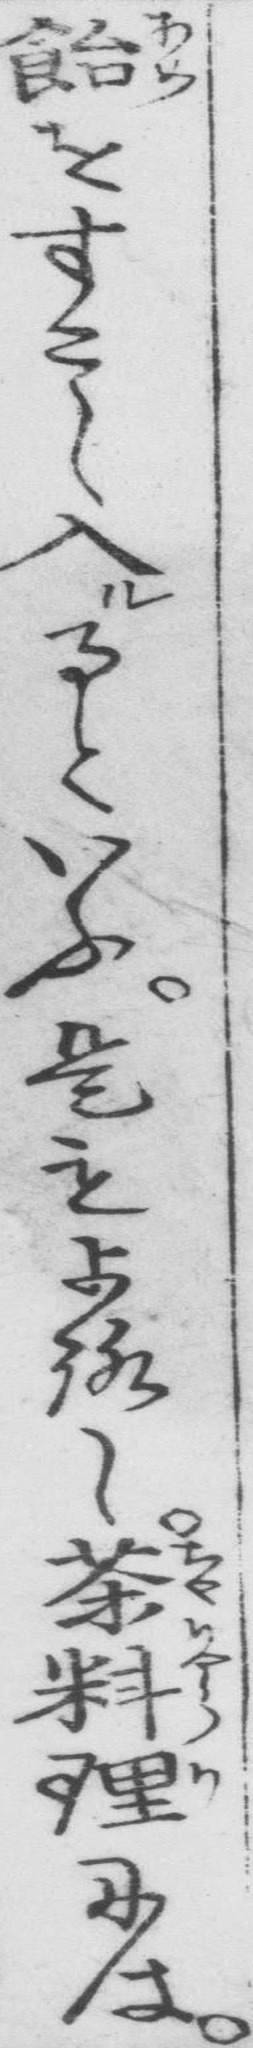飴をすこし入るといふ。是もよろし。茶料理には。

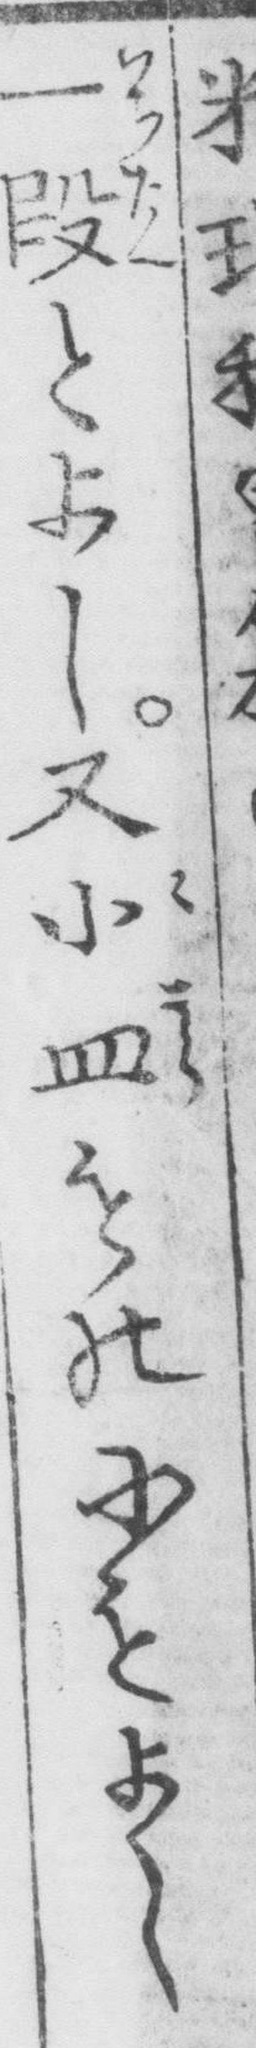一段とよし。又小皿ものにもよし
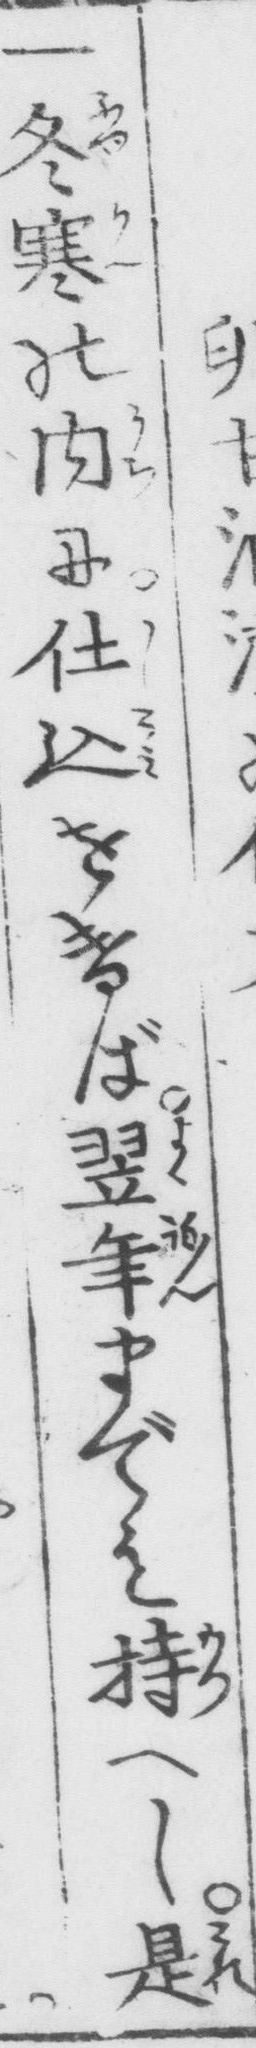一冬寒の内に仕込をけば。翌年までも持へし。是
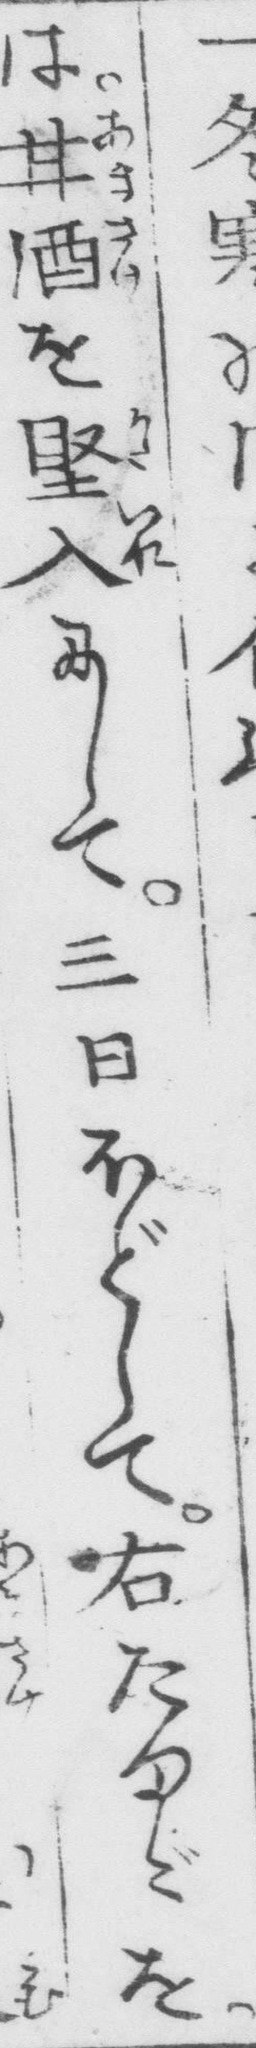は。甘酒を堅入にして。三日ほどして。右たまごを。
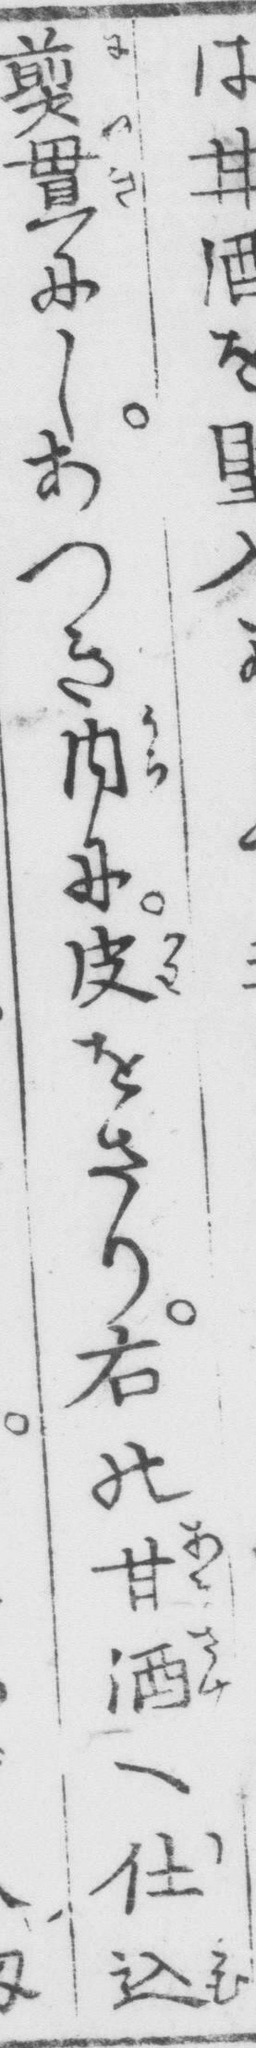煎貫にし。あつき内に。皮をさり。右の甘酒へ仕込
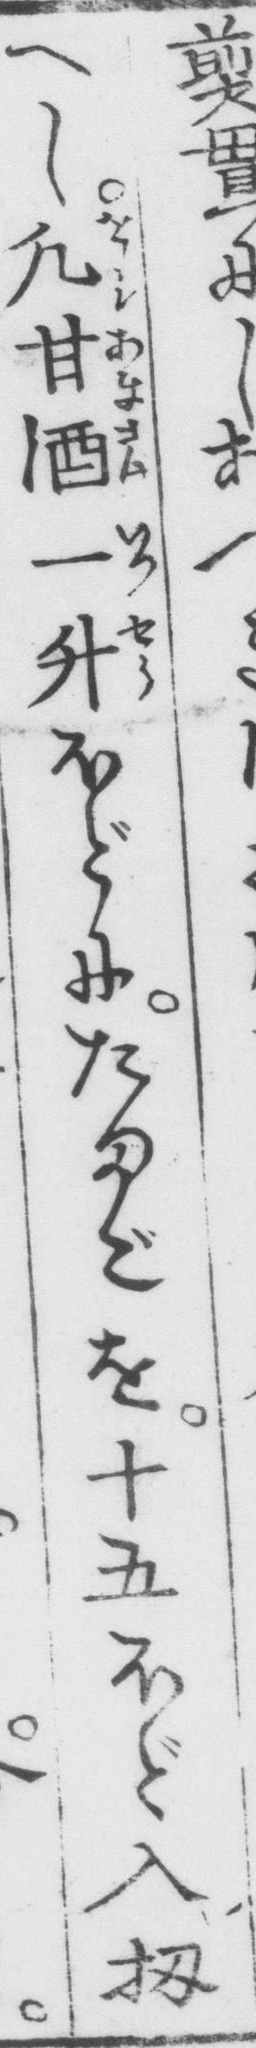へし。凡甘酒一升ほどに。たまごを。十五ほど入れ扨
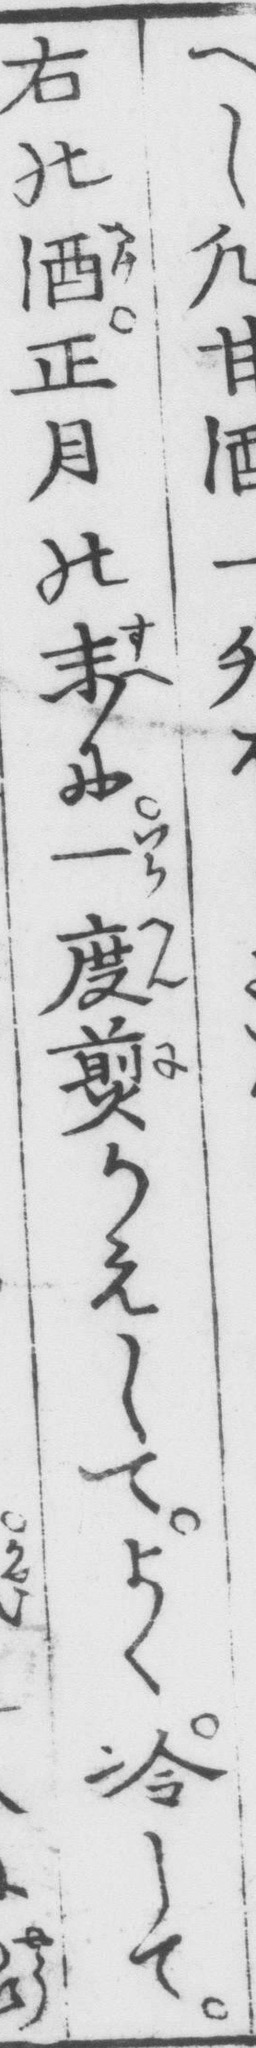右の酒。正月の末に、一度煎かえして。よく。冷して。
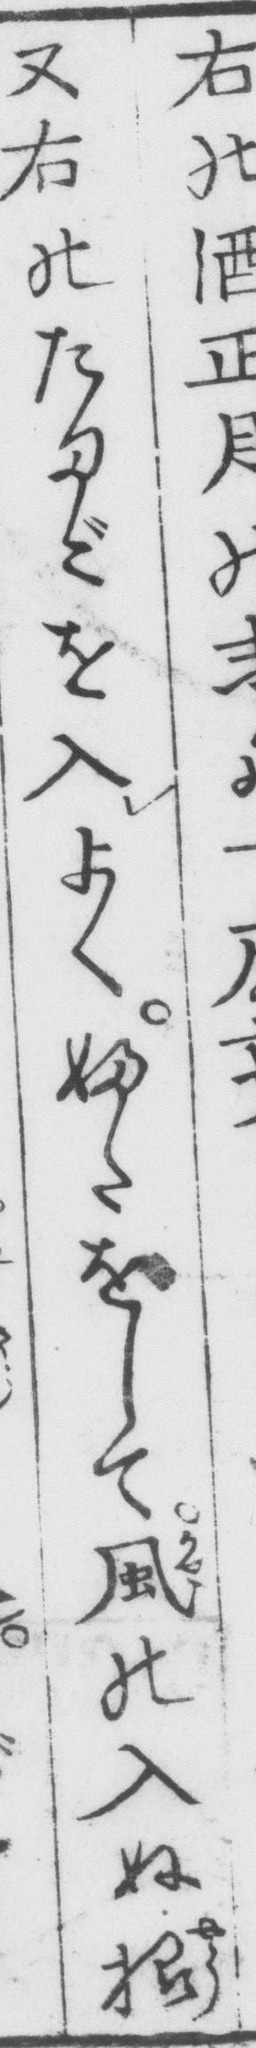又右のたまごを入れよく。ふたをして。風の入ぬ様
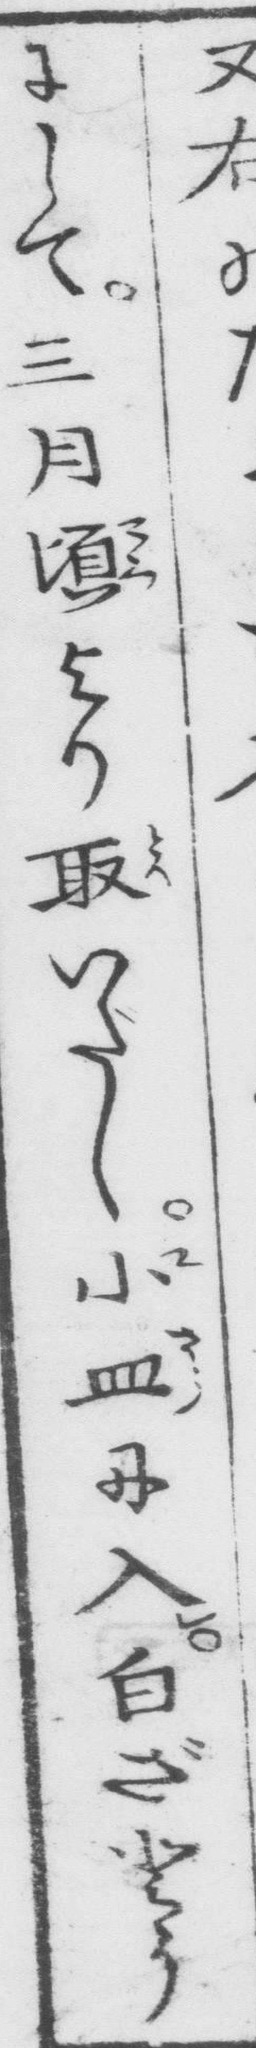にして。三月頃より取いたし。小皿に入れ。白ざとう
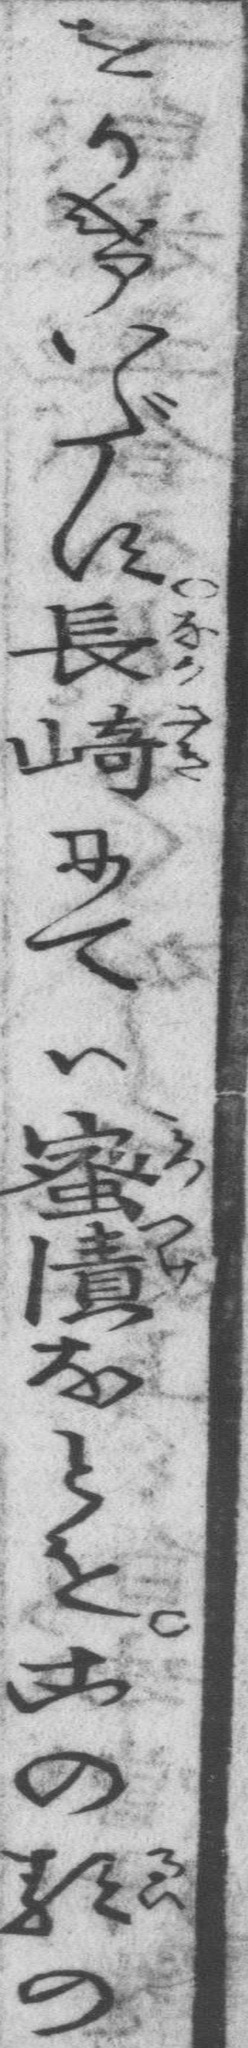をかけいだす。長崎にては蜜漬なとも。この類の
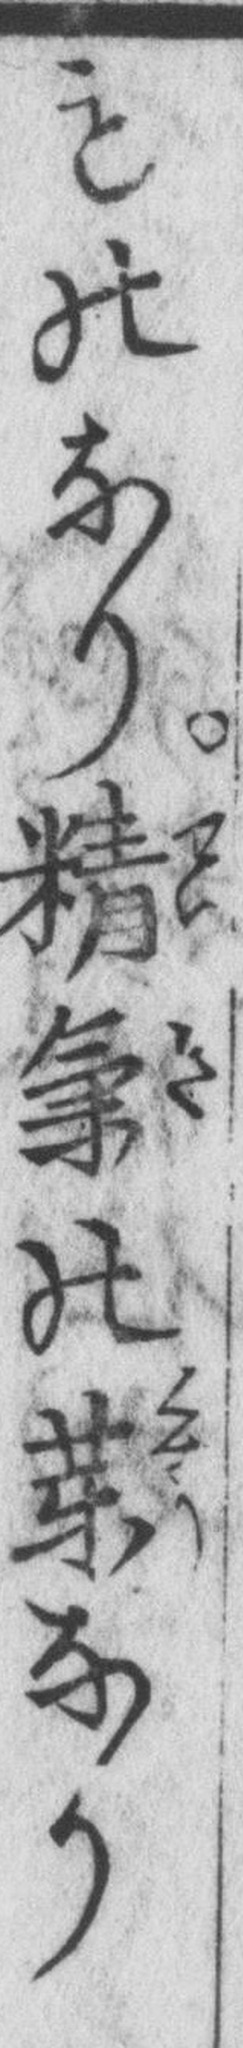ものなり。精気の薬なり
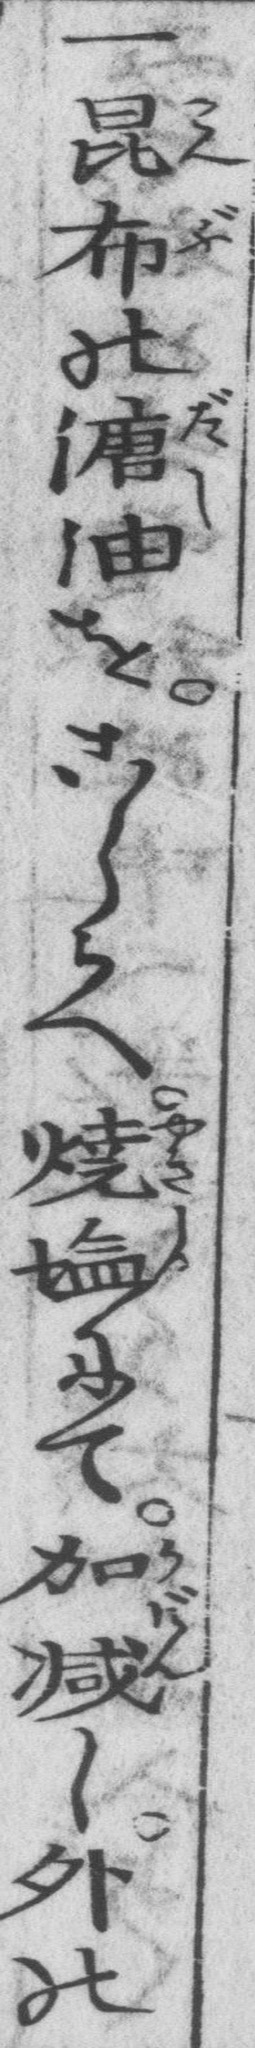一昆布の溏油を。こしらへ。焼塩にて。加減し。外の
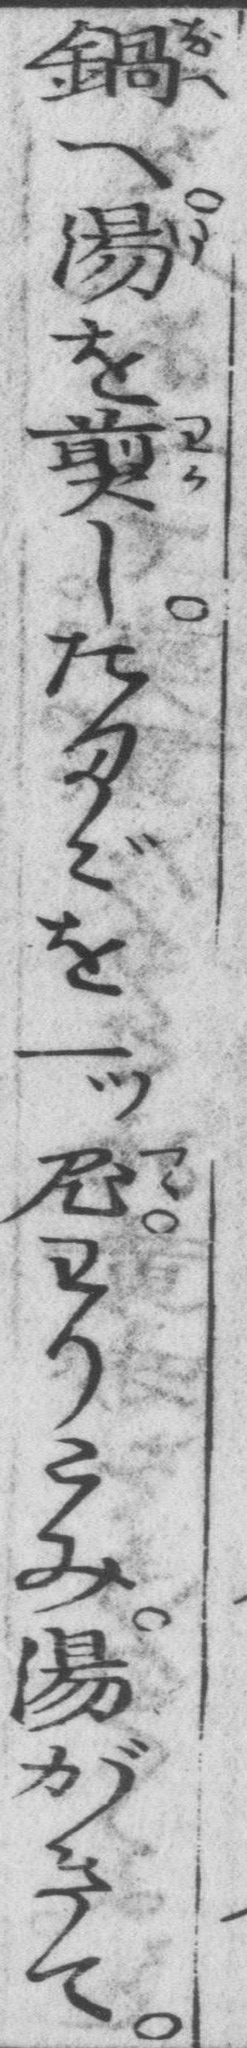鍋へ。湯を煎し。たまごを一ツ宛。わりこみ。湯がきて。
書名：萬寳料理秘密箱
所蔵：大阪府立大学学術情報センター 国文学研究資料館
